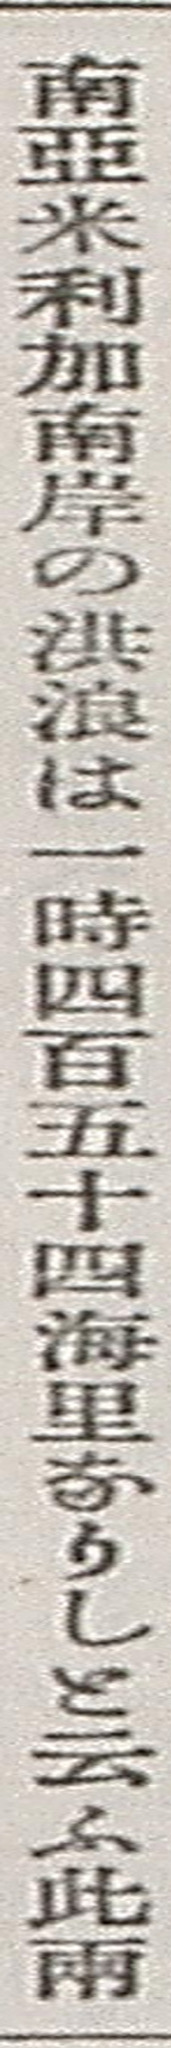南亜米利加南岸の洪浪は一時四百五十四海里なりしと云ふ此両
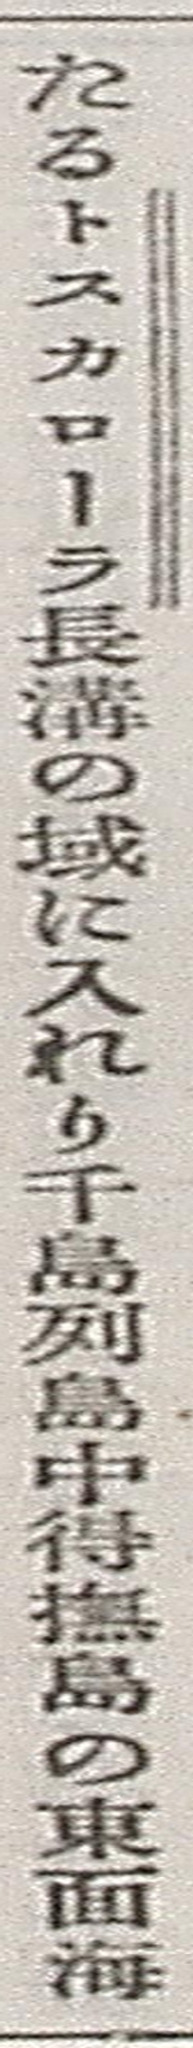たるトスカローラ長溝の域に入れり千島列島中得撫島の東面海
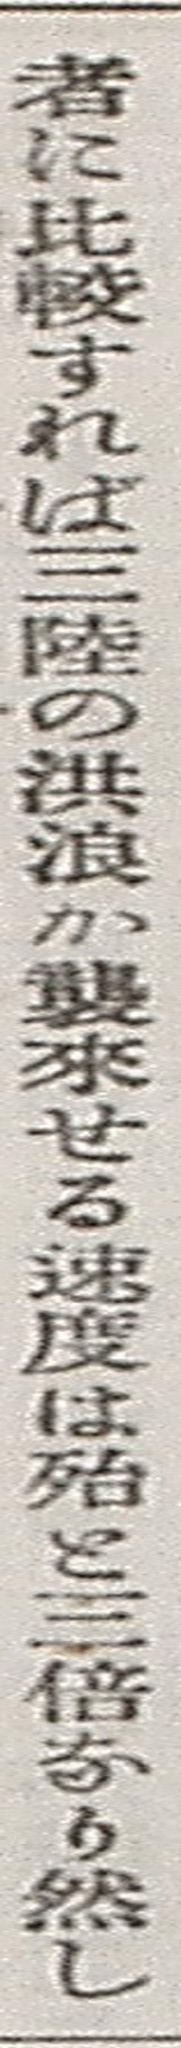者に比較すれは三陸の洪浪か襲来せる速度は殆と三倍なり然し
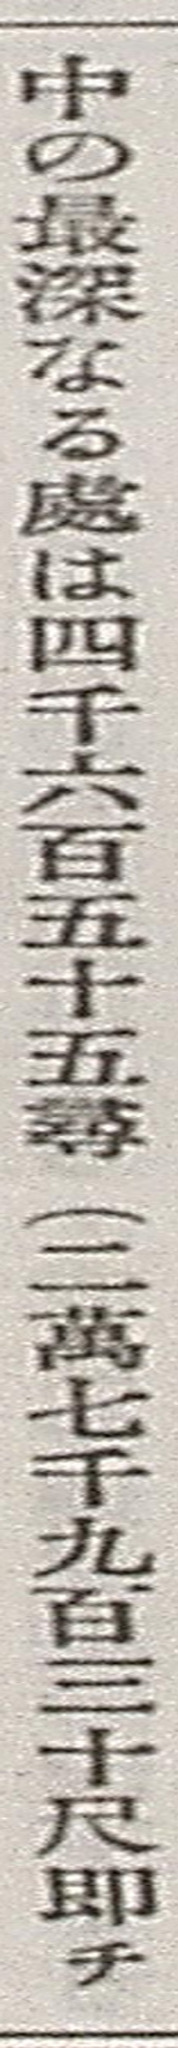中の最深なる処は四千六百五十五尋（二万七千九百三十尺即チ
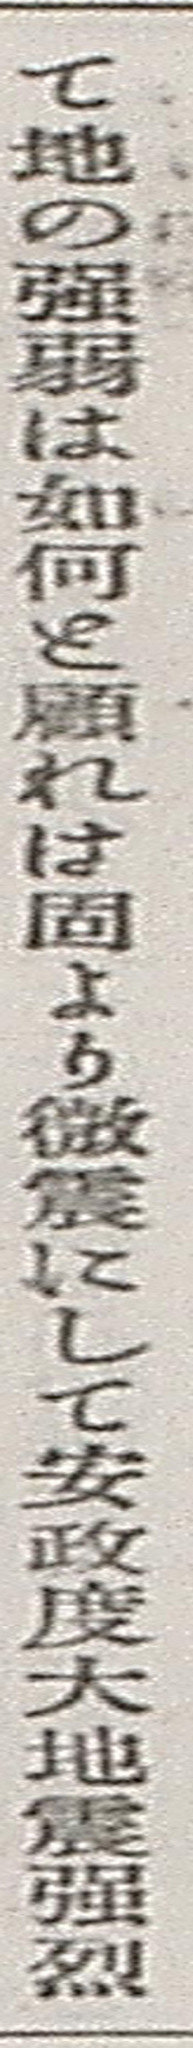て地の強弱は如何と顧れは固より微震にして安政度大地震強烈
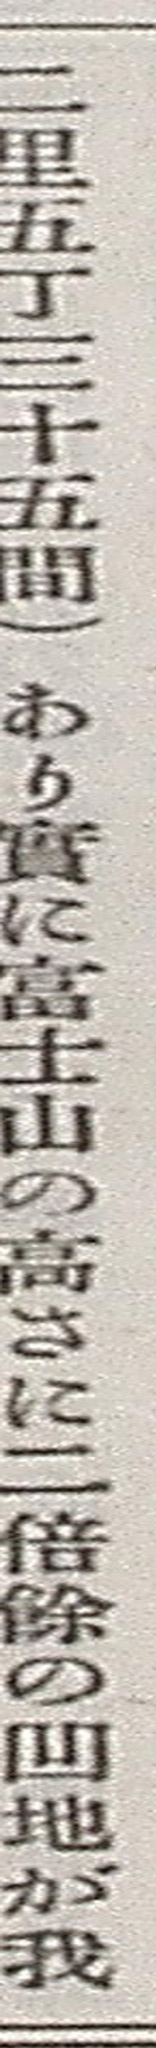二里五丁三十五間）あり実に富士山の高さに二倍余の凹地が我
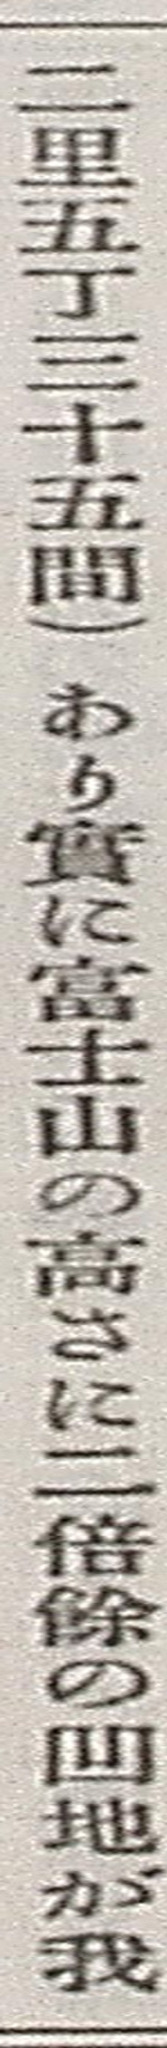二里五丁三十五間）あり実に富士山の高さに二倍余の凹地が我
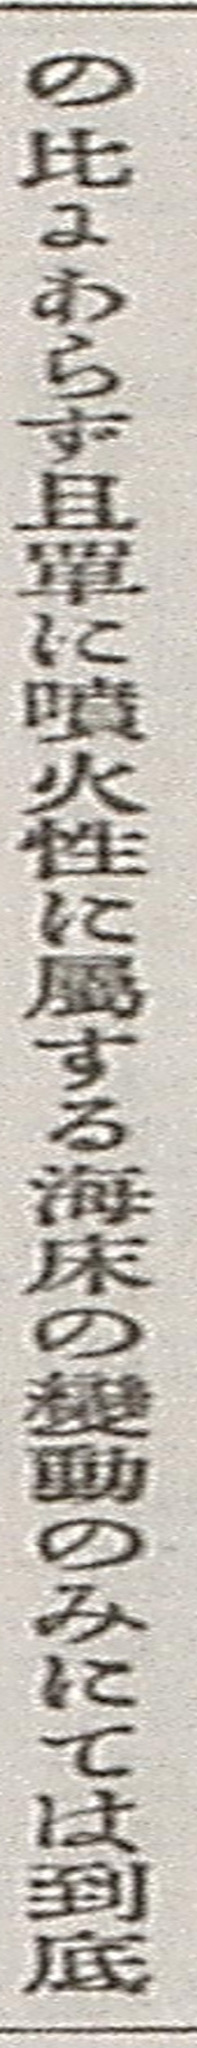の比にあらず且単に噴火性に属する海床の変動のみにては到底
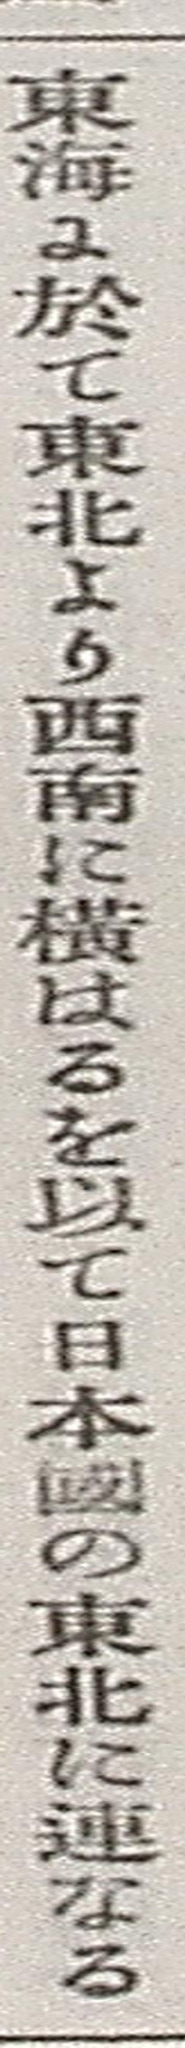東海に於て東北より西南に横はるを以て日本国の東北に連なる
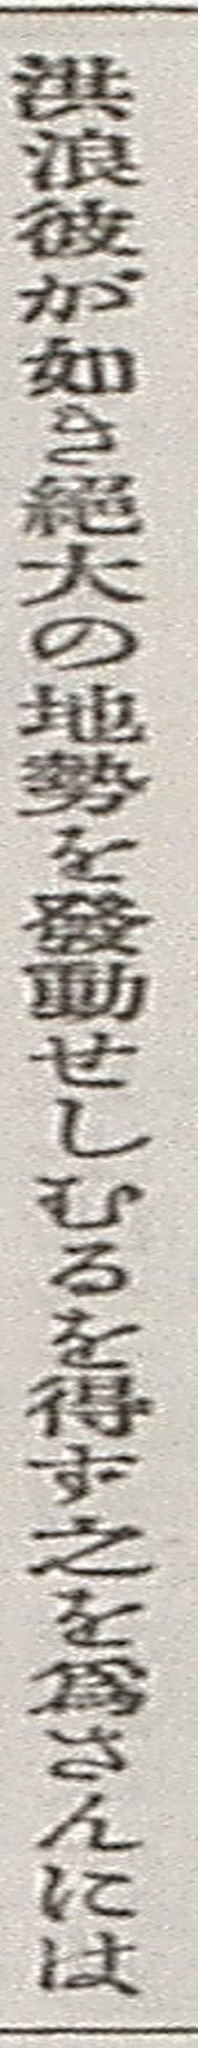洪浪彼が如き絶大の地勢を発動せしむるを得ず之を為さんには
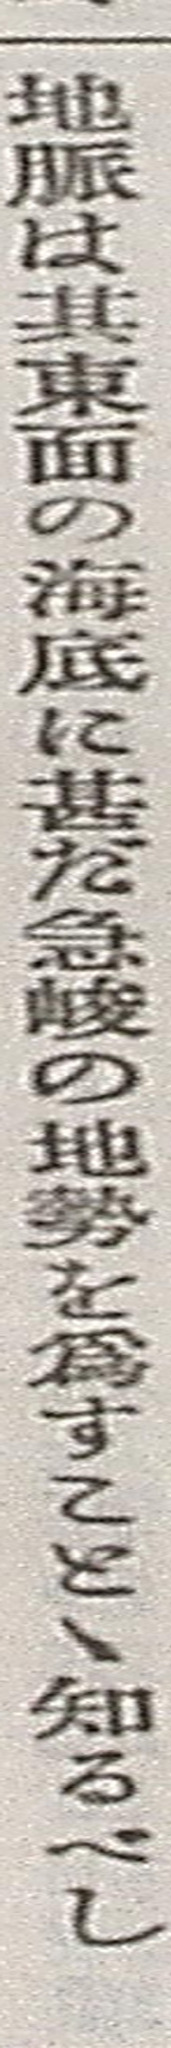地脈は其東面の海底に甚だ急峻の地勢を為すことゝ知るべし
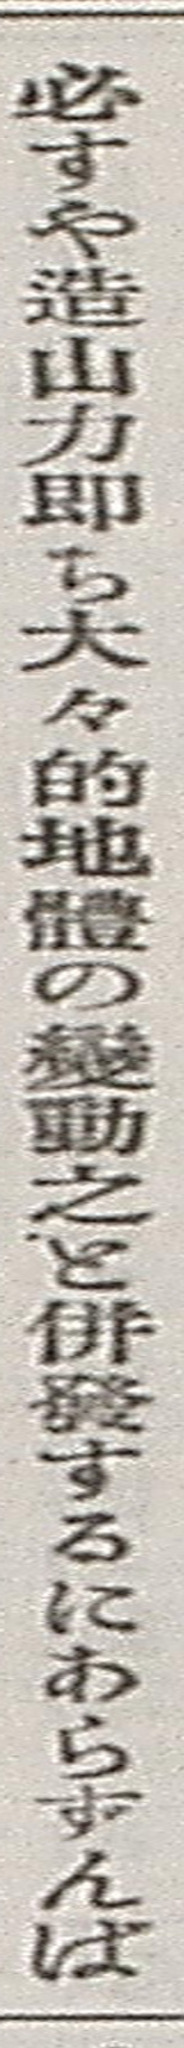必ずや造山力即ち大々的地体の変動之と併発するにあらずんば
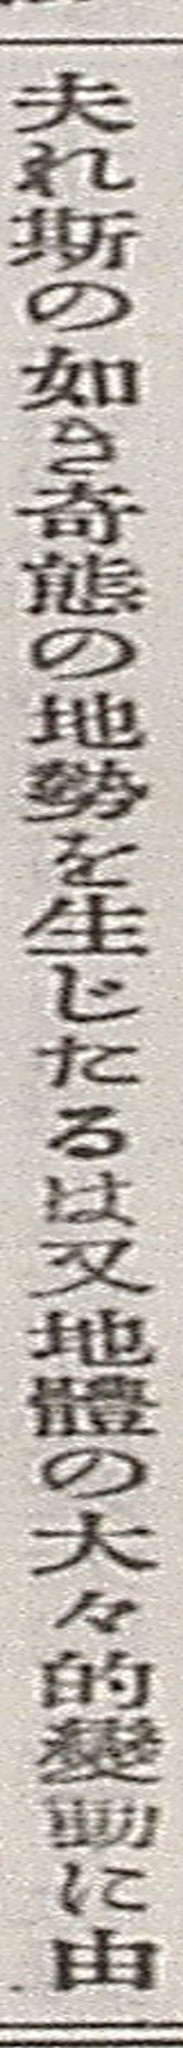夫れ斯の如き奇態の地勢を生じたるは又地体の大々的変動に由
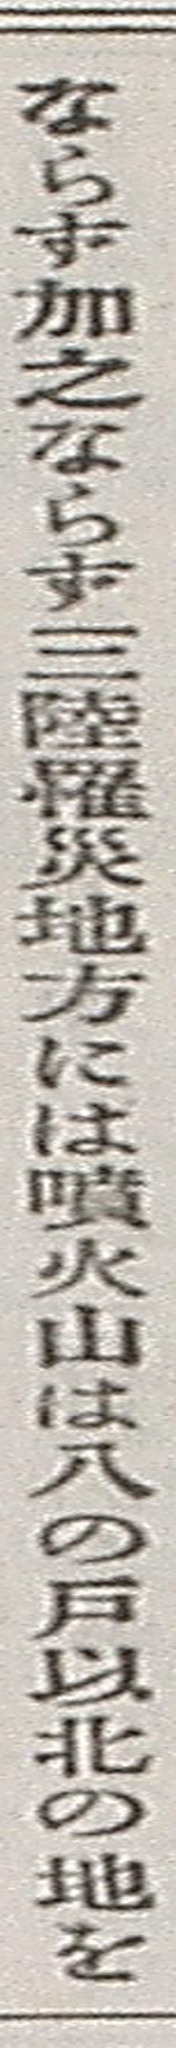ならず加之ならず三陸罹災地方には噴火山は八の戸以北の地を
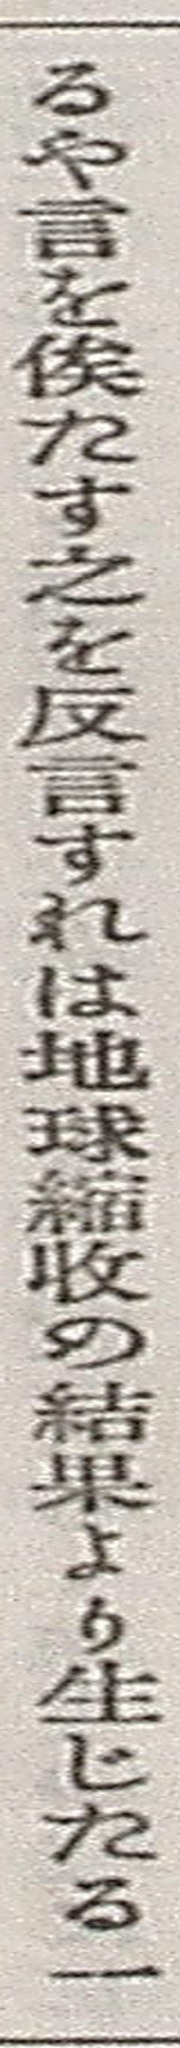るや言を俟たす之を反言すれは地球縮収の結果より生じたる一
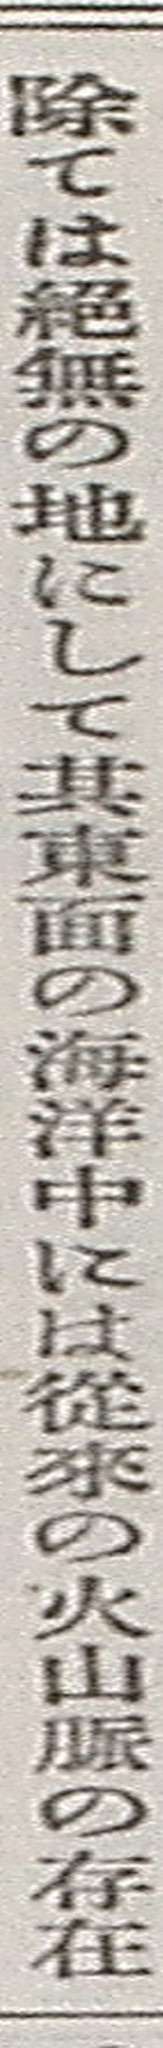除ては絶無の地にして其東南の海洋中には従来の火山脈の存在
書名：風俗畫報臨時増刊第百二十號　大海嘯被害録（下）
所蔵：東京大学地震研究所図書室 Earthquake Research Institute Library, The University of Tokyo, JAPAN
